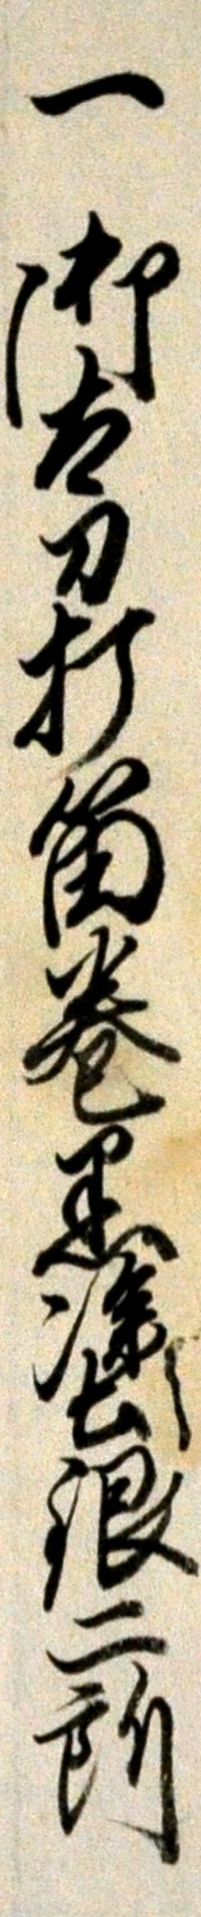一御太刀打笛巻黒塗銀二所
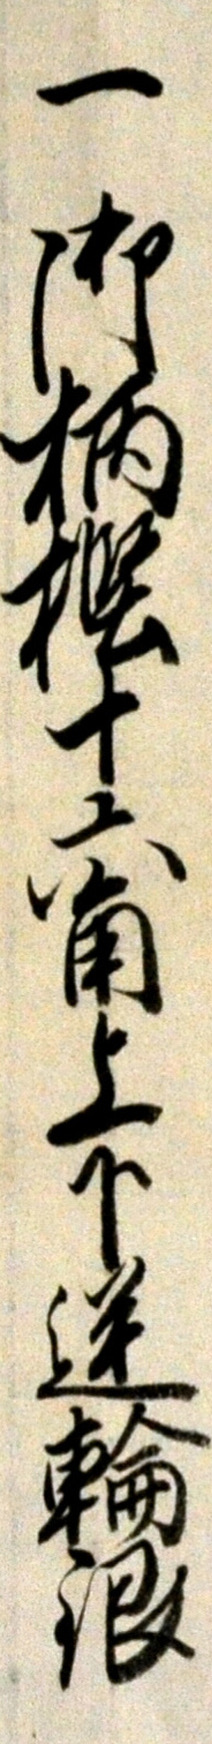一御柄樫十六角上下逆輪銀
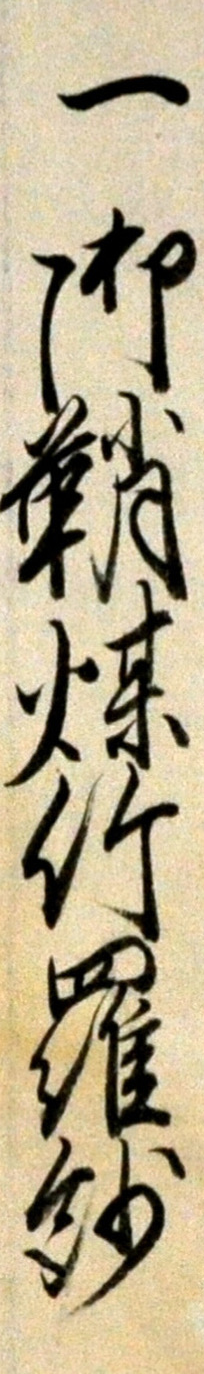一御鞘煤竹羅紗
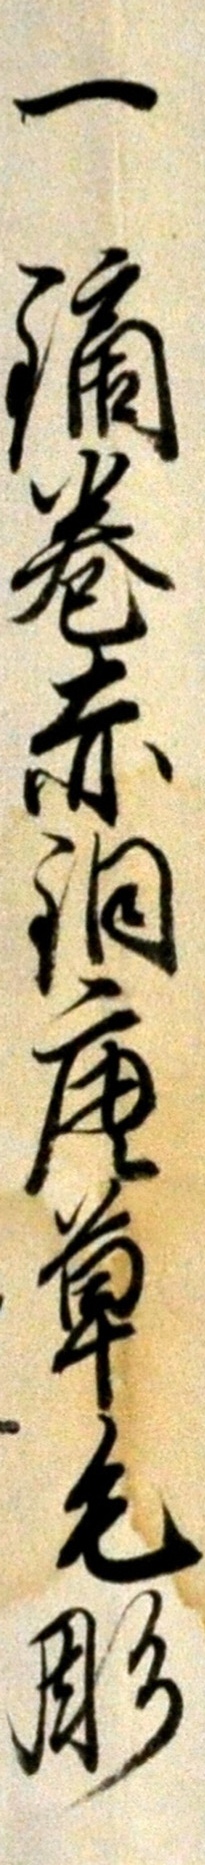一鏑巻赤銅唐草毛彫
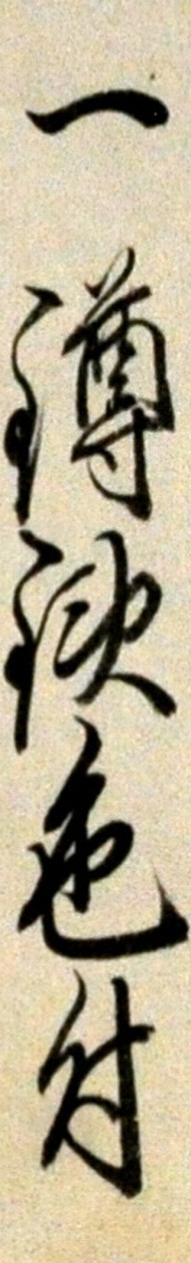一鐏鉄色付
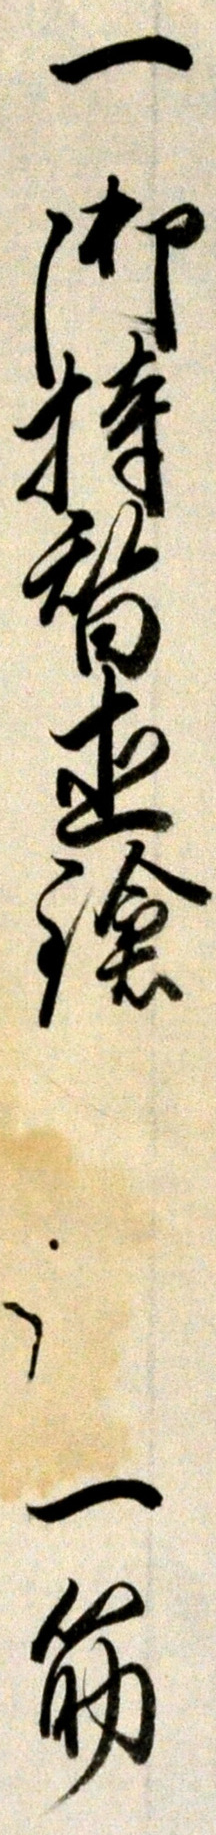一御持替直鎗一筋
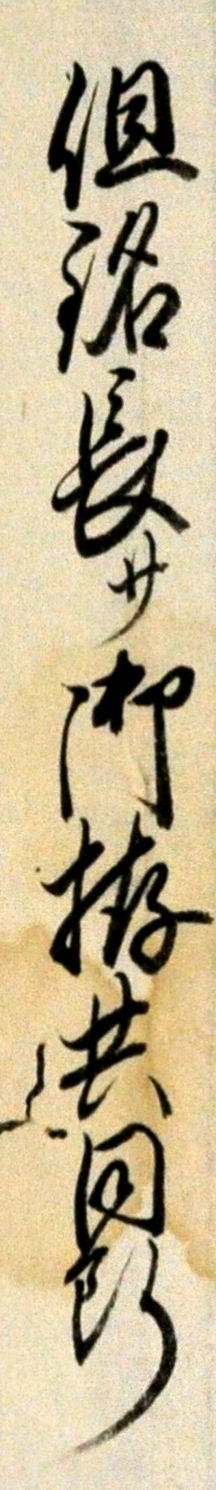但銘長サ御拵共同断
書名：御持鎗拵書
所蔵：伊那市立高遠町図書館・合同会社AMANE
